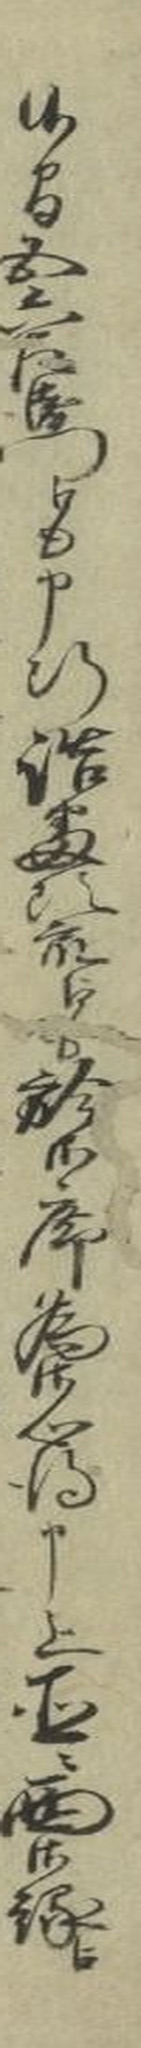候間五六左衛門えも申断詰番頭衆えも於御席為御心得申上直に西御縁え
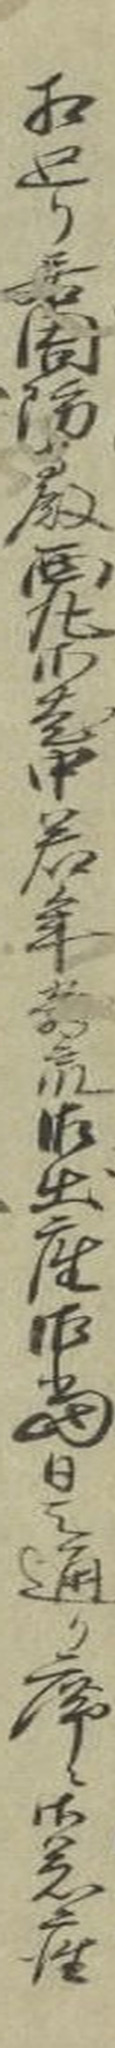相廻り居周防守殿西丸御老中若年寄衆御出座御当日之通り席に御着座
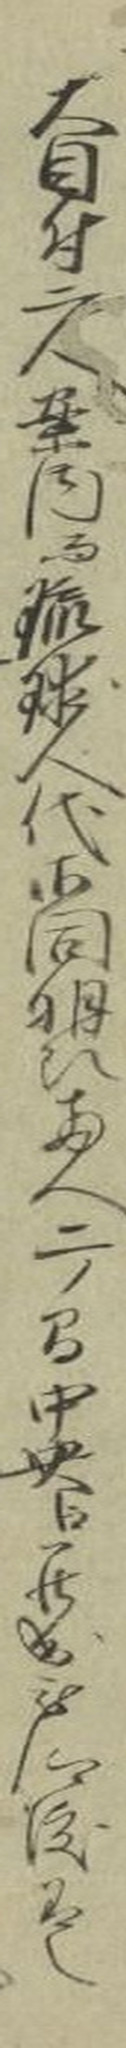大目付二人案内而琉球人代御同朋頭両人二の間中央え罷出被仰渡有之
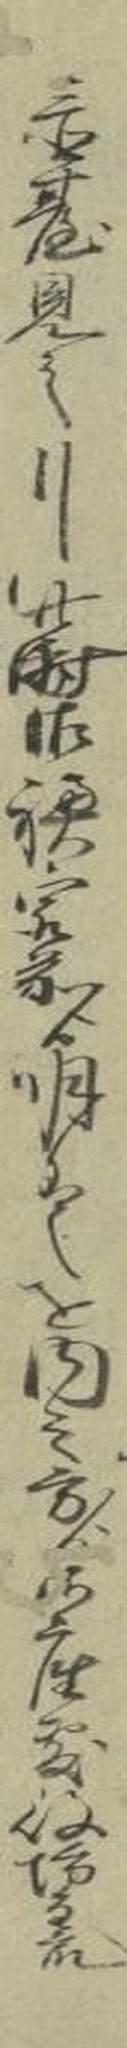置台見之引此時御襖最前ゟ明有之を内之方ゟ御座敷役坊主衆
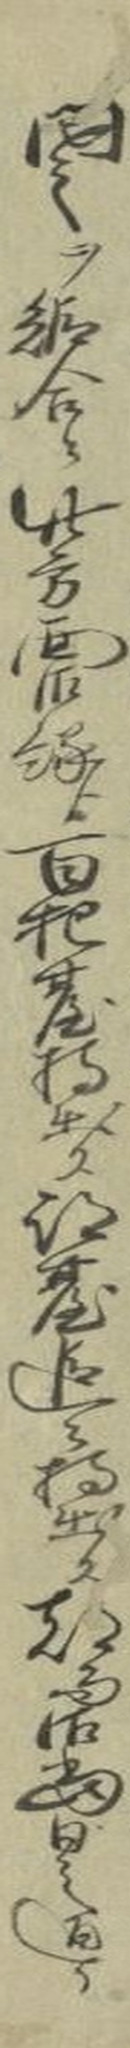閉之を縦合に此方西御縁え百把台持出す跡台迄持出す都て御当日之通り
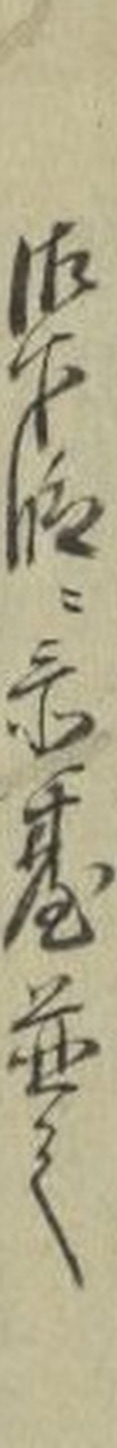一御下段に置台並之
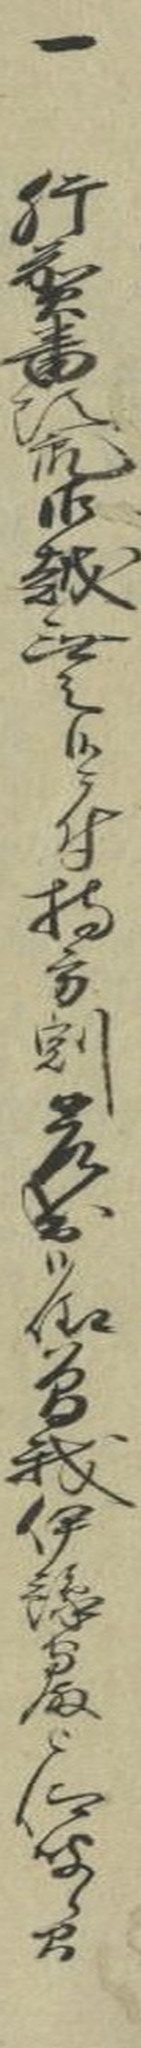一御車寄之方御目緞越無之候に付持方割差出候様曽我伊予守殿被仰聞候間
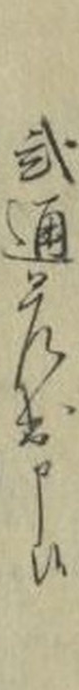弐通差出申候
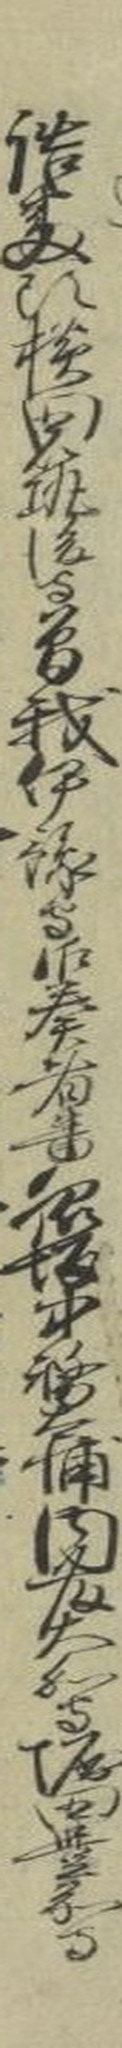一詰番頭横田筑前守曽我伊予守御奏者番脇坂中无太輔内藤大和守堀田豊前守
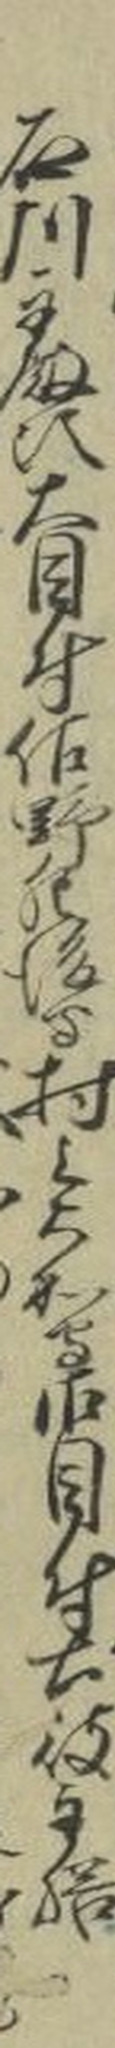石川主殿頭大目付佐野肥後守村上大和守御目付土岐主膳
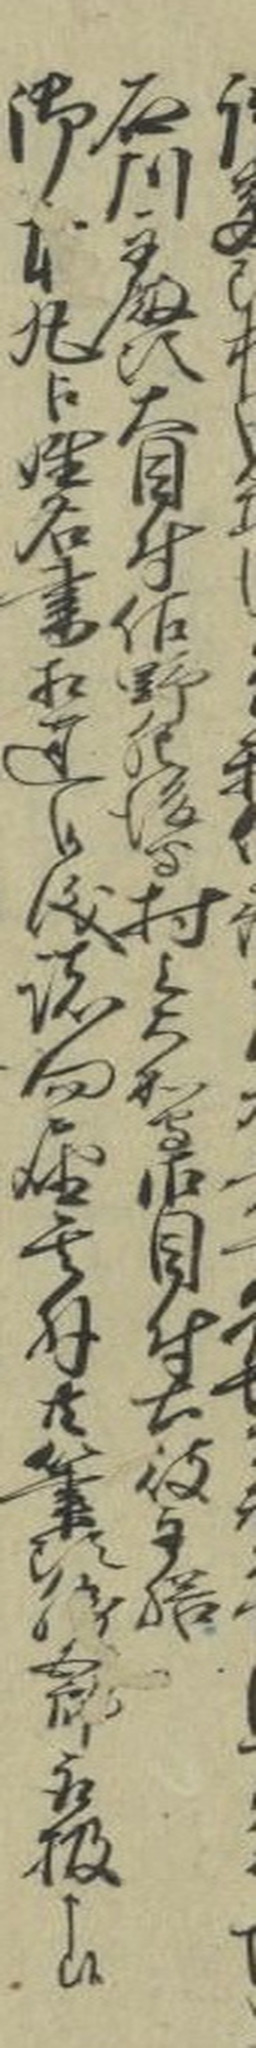一御本丸え姓名書相達候儀諸向届其外共筆頭勝五郎取扱申候
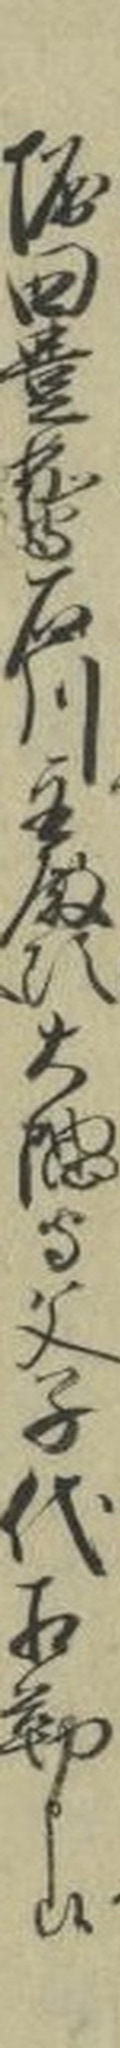一堀田豊前守石川主殿頭大隅守父子代相勤申候
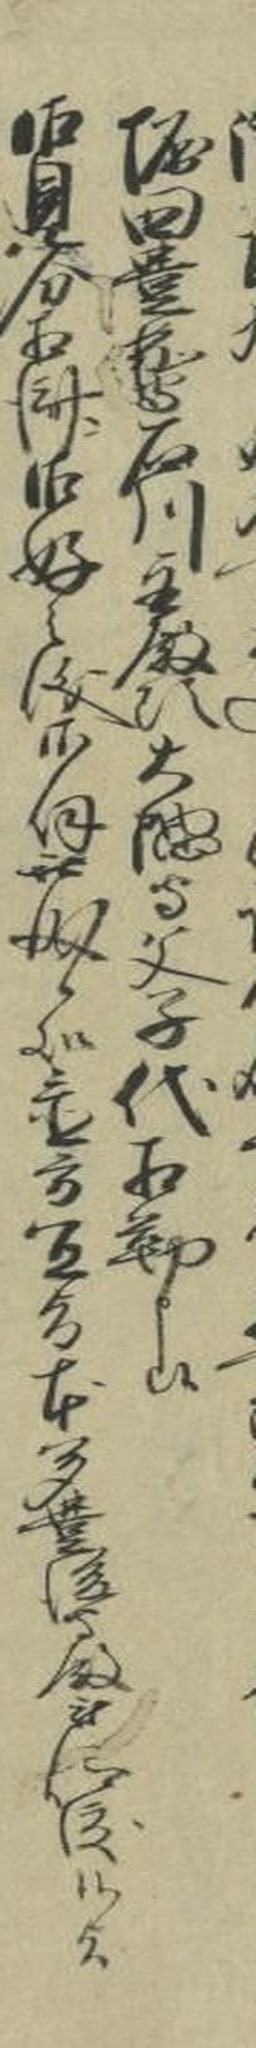一御見分相済御好之儀御伺被成候処置方宜旨本多豊後守殿被仰渡候旨
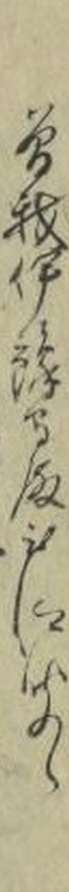曽我伊予守殿被仰聞候
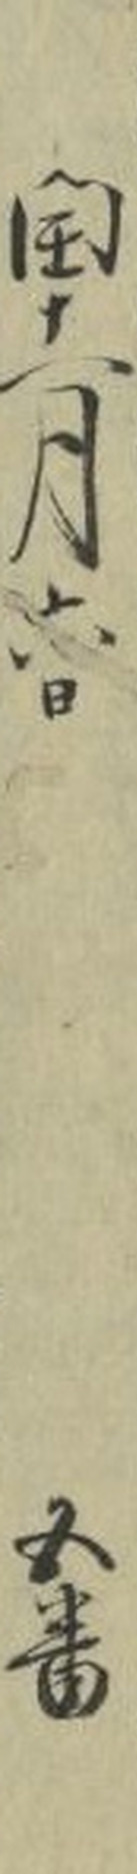閏十一月六日五番
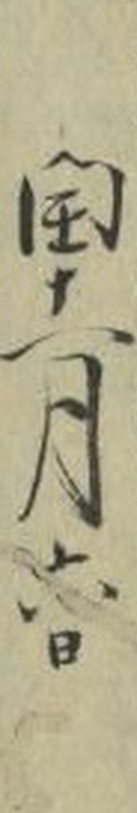閏十一月七日
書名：天保三壬辰年琉球人参府之節勤方書留
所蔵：University of the Ryukyus Library
